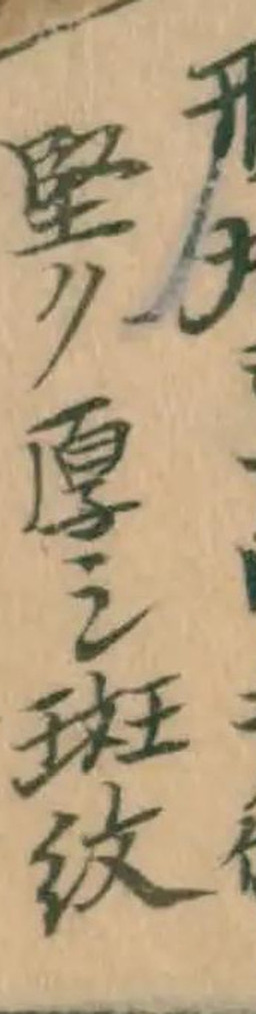堅ク厚シ斑紋
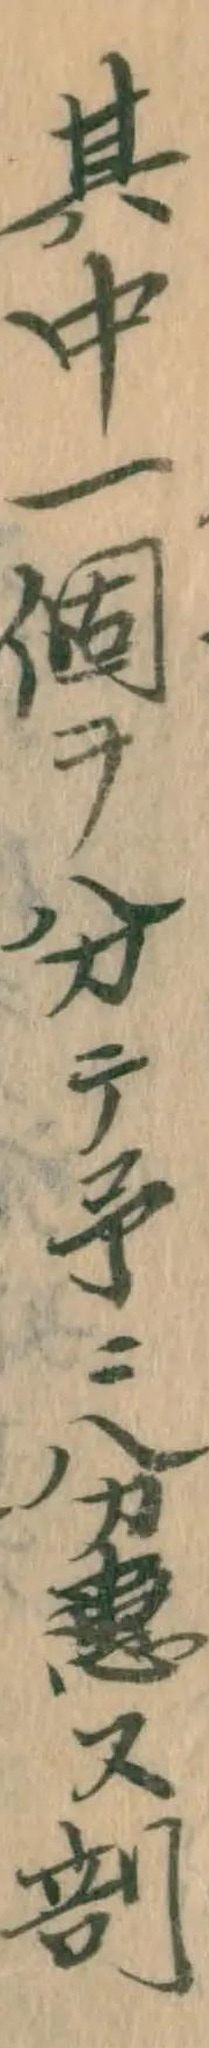其中一個ヲ分テ予ニ分惠ス剖
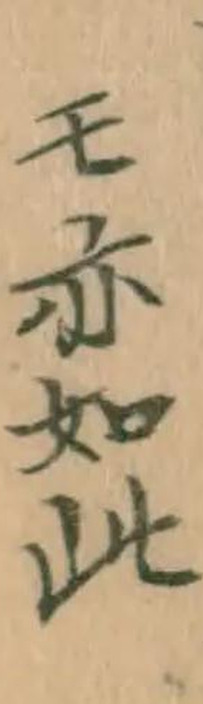モ亦如此
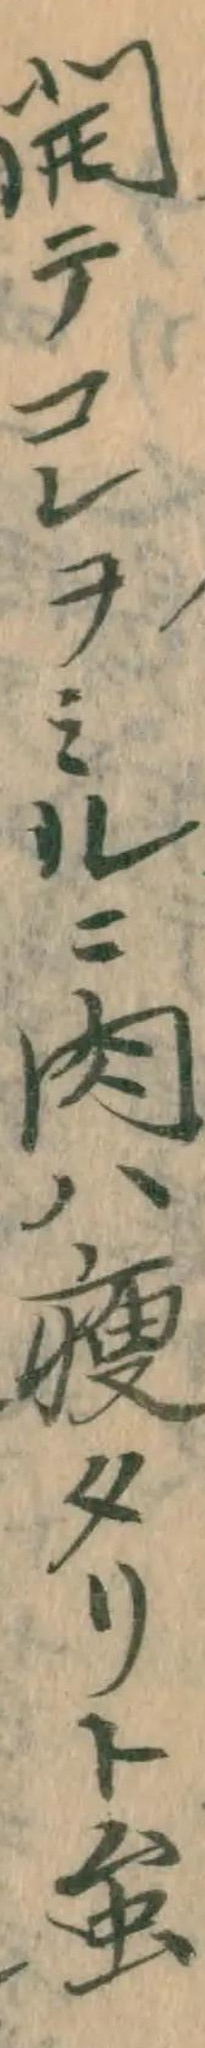開テコレヲミルニ肉ハ痩タリト虽
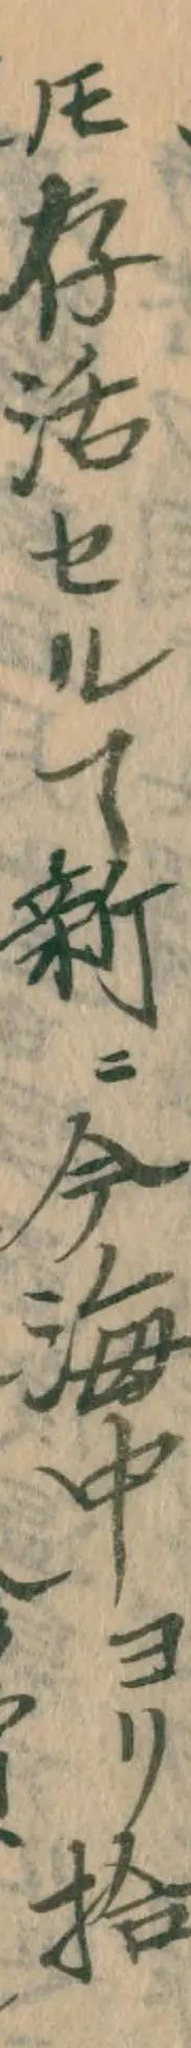トモ存活セルコト新ニ今海中ヨリ拾
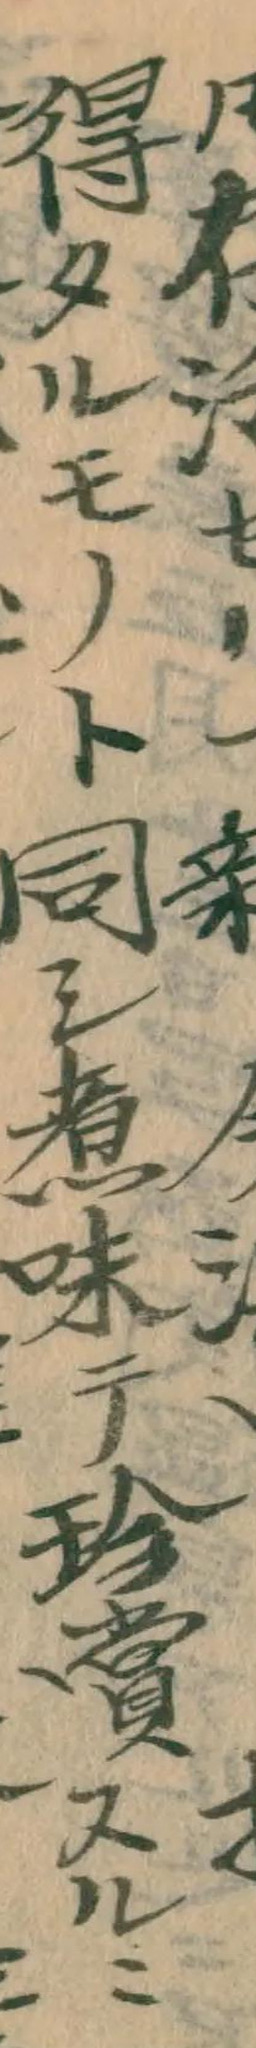得タルモノト同シ煮味テ珍賞スルニ
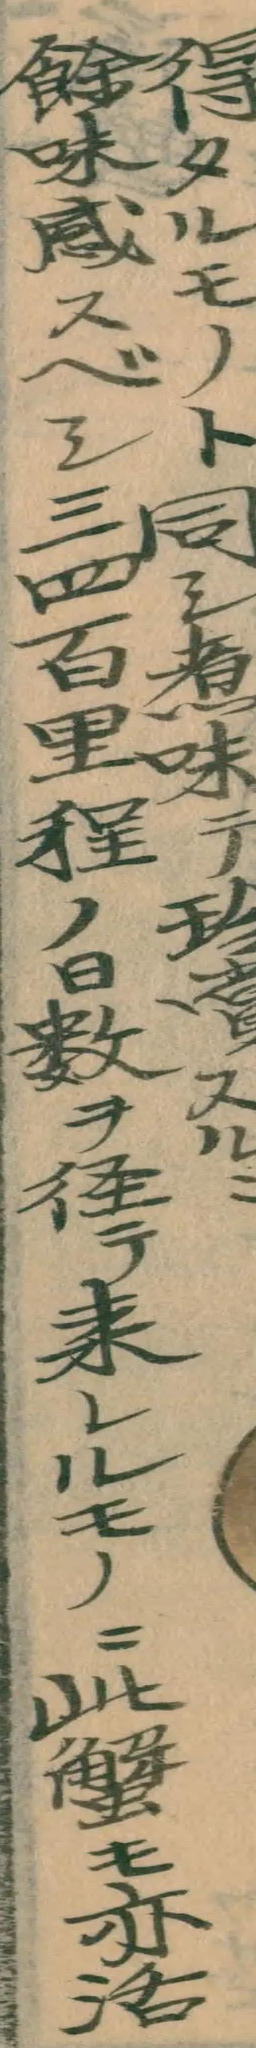餘味感スベシ三四百里程ノ日数ヲ径テ来レルモノニ此蟹モ亦活
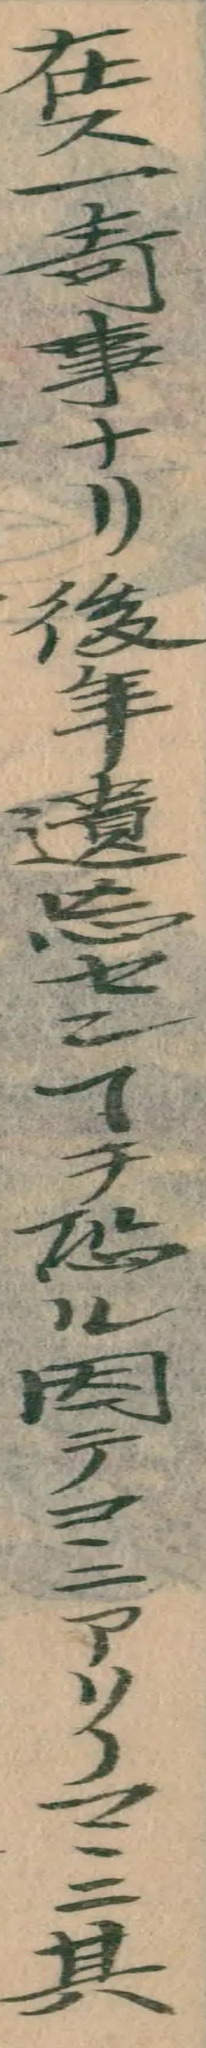存ス一奇事ナリ後年遺忘センコトヲ恐ル因テコヽニアリノマヽニ其
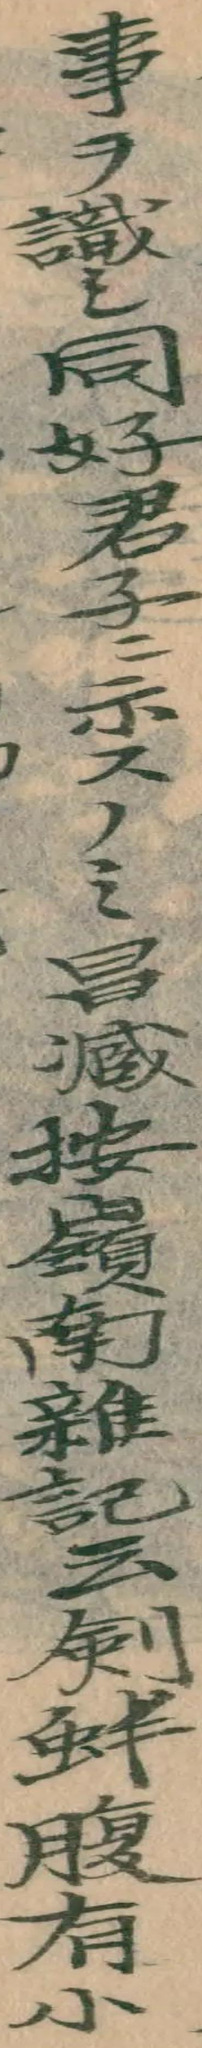事ヲ識シ同好君子ニ示スノミ昌臧按嶺南雑記云剣蚌腹有小
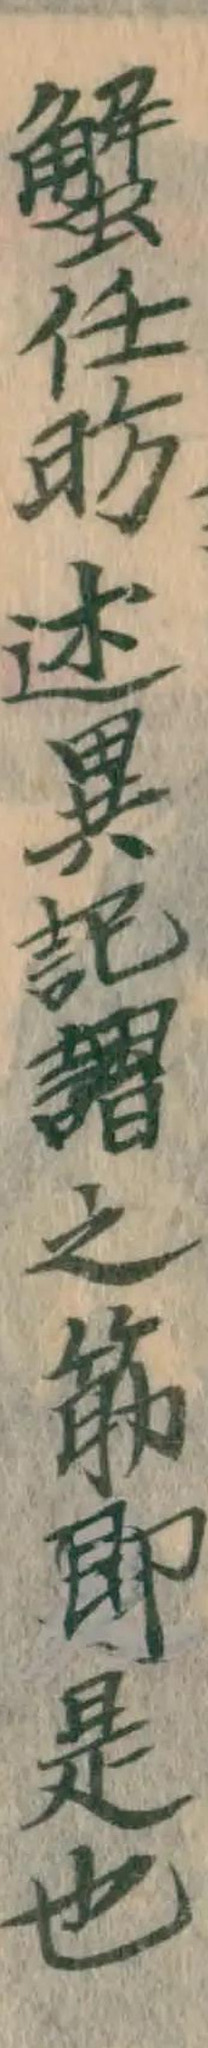蟹任昉述異記謂之筋即是也
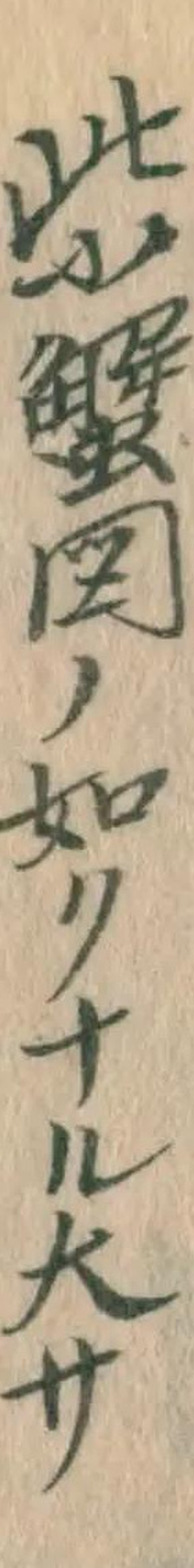此小蟹図ノ如クナル大サ
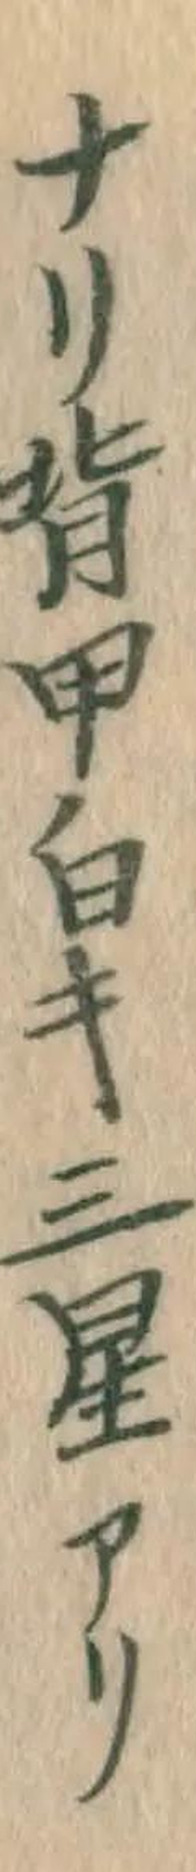ナリ背甲白キ三星アリ
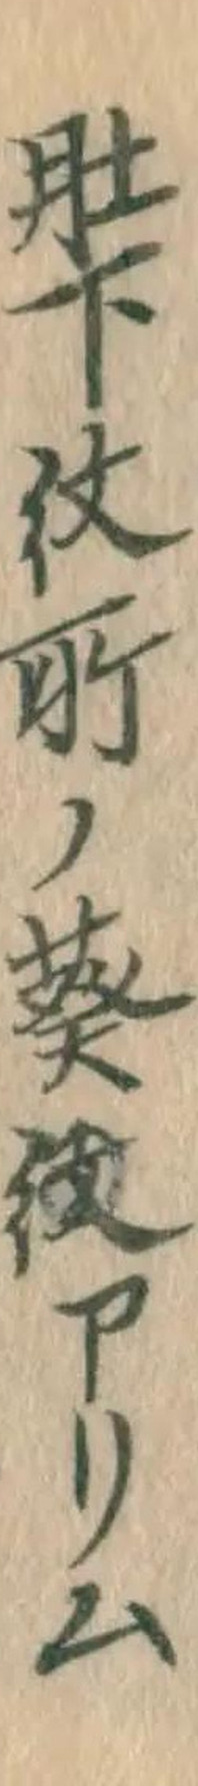肚下紋所ノ葵紋アリム
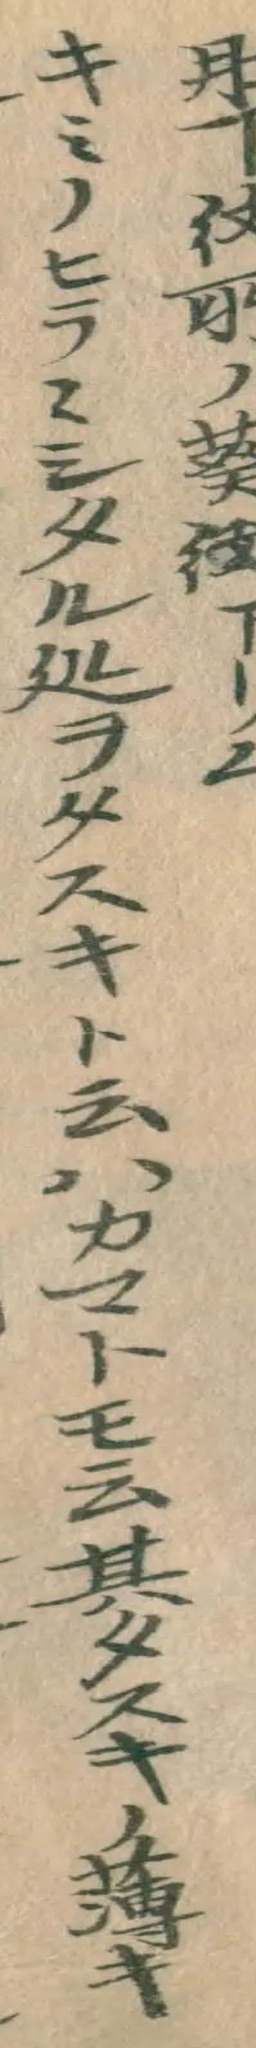キミノヒラ々シタル処ヲタスキト云ハカマトモ云其タスキノ薄キ
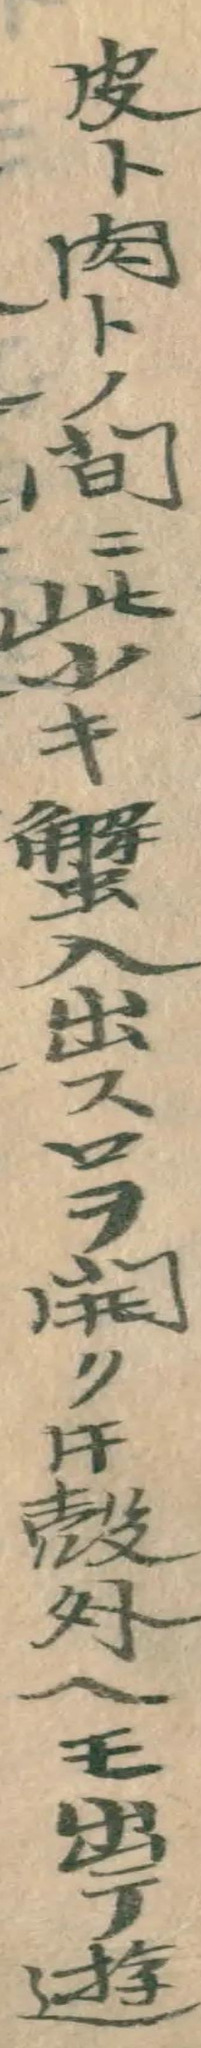皮ト肉トノ間ニ此小キ蟹入出ス口ヲ開クトモ殻外ヘモ出テ遊
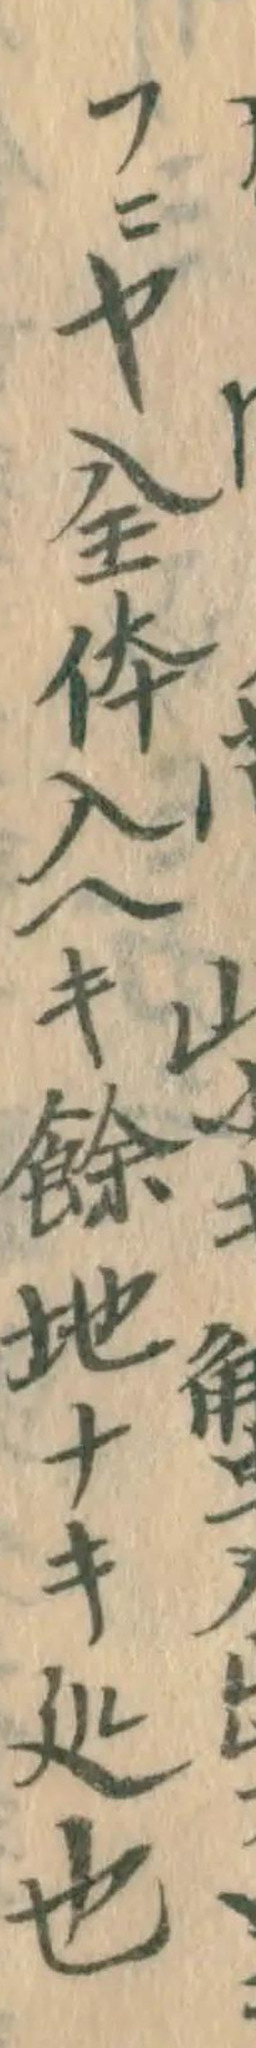フニヤ全体入ヘキ餘地ナキ処也
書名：千蟲譜 3巻. [2]
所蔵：国立国会図書館 National Diet Library, JAPAN
